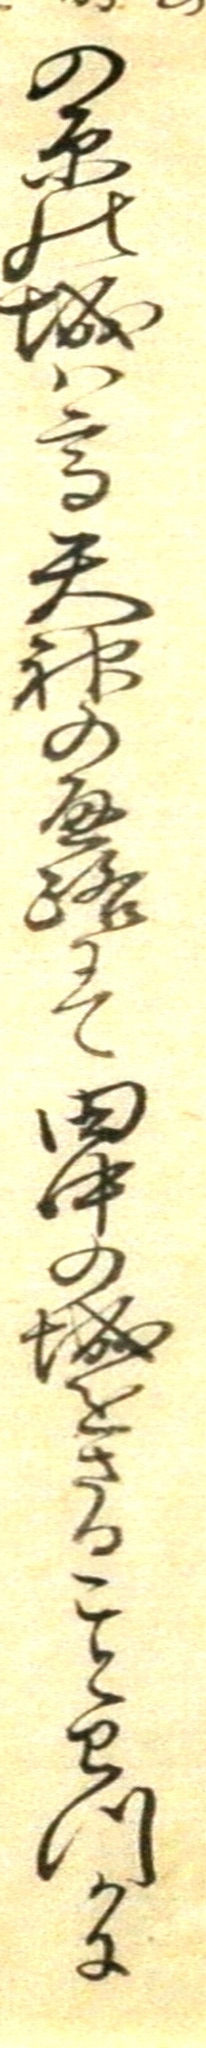の原の城は高天神の通路にて田中の城をさることわつかに
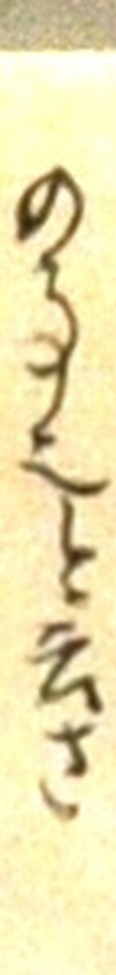の事也と云さ
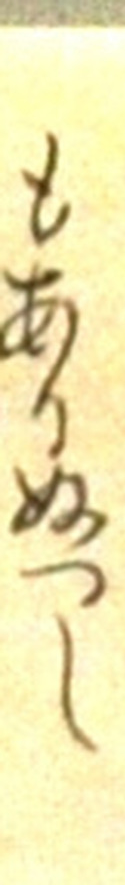もありぬへし
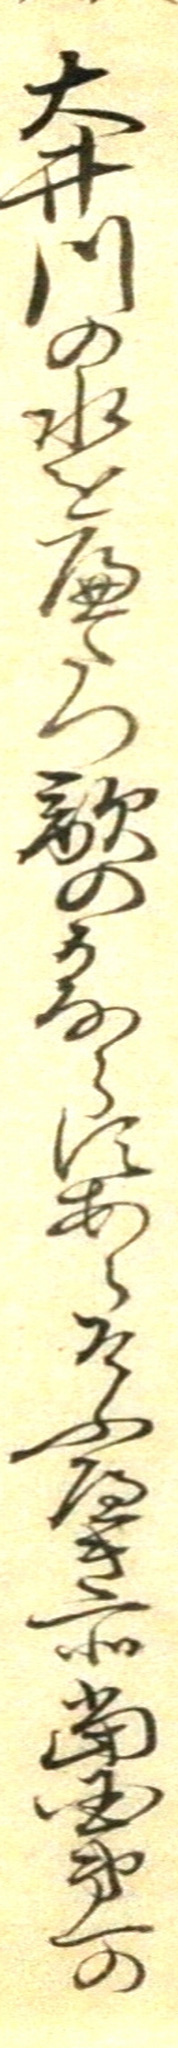大井川の水をへたつ敵のかならすあらそふへき所当国第一の
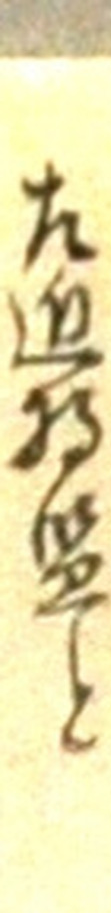左近将監と
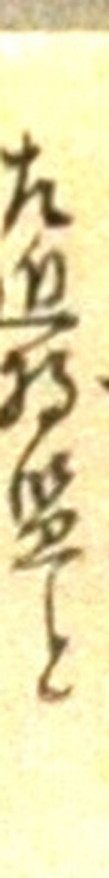左近将監と
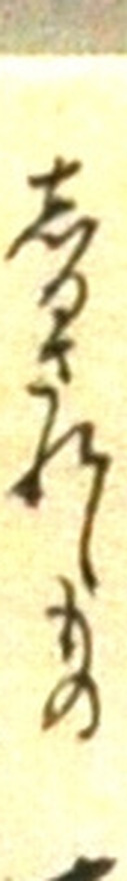しるされしもの
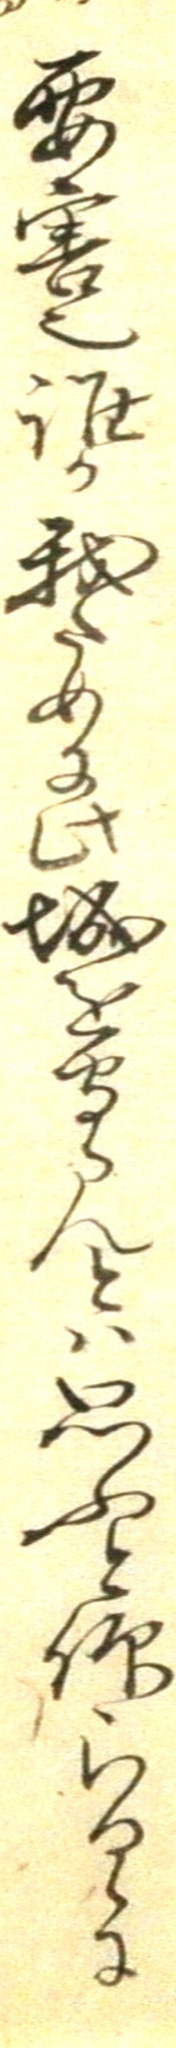要害也誰か我ために此城を守らんとは思ふと仰らるゝに
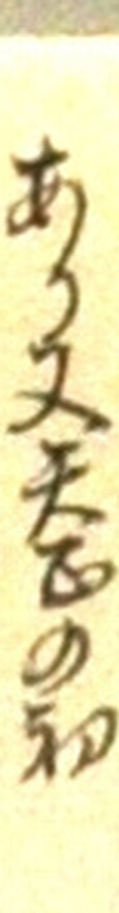あり又天正の初
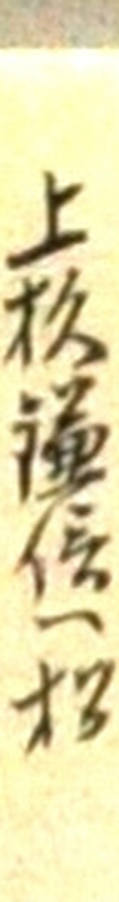上杉謙信へ松
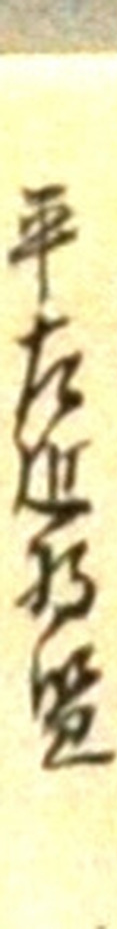平左近将監
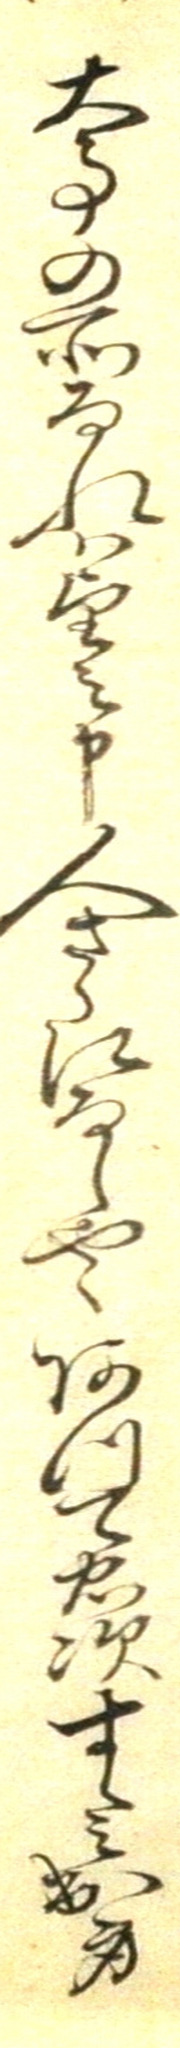大事の所なれは望み申人さらになしやゝあつて忠次すゝみ出身
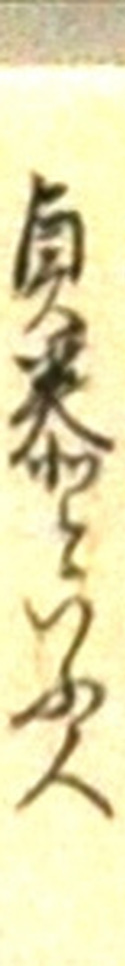貞泰といふ人
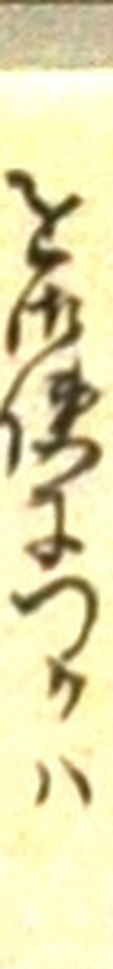を御使につかは
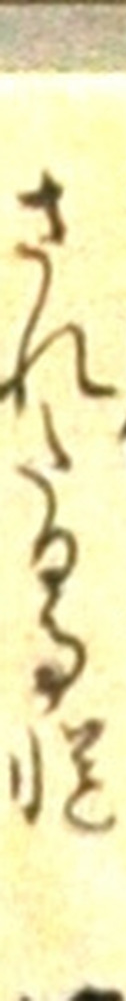されたる事慥
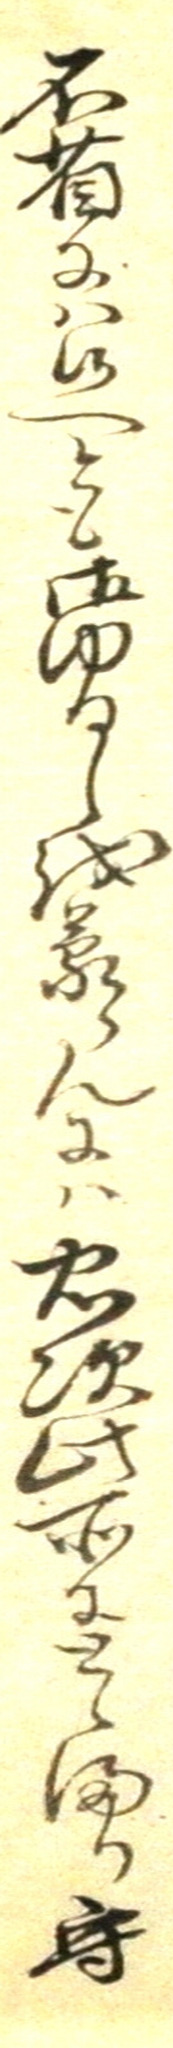不省には候へとも御ゆるしを蒙らんには忠次此所にとゝまり守
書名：藩翰譜（四・下）
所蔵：伊那市立高遠町図書館・合同会社AMANE
